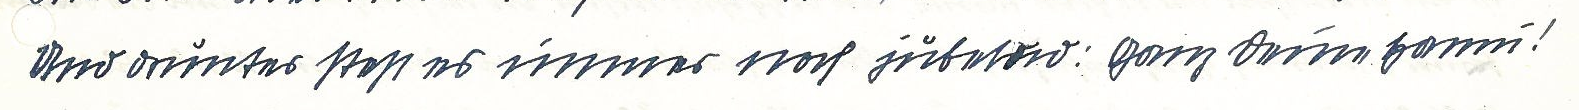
Und darunter steht es immer noch jubelnd: Ganz Deine !
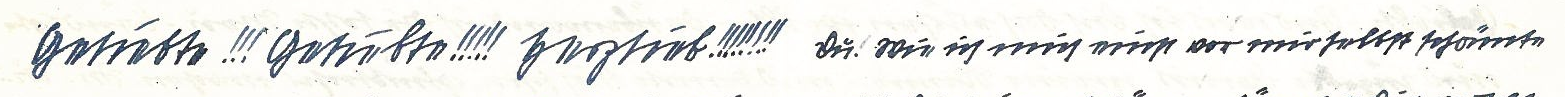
Geliebte!!! Geliebte!!!!! Herzlieb!!!!!!!! Du. Wie ich mich einst vor mir selbst schämte
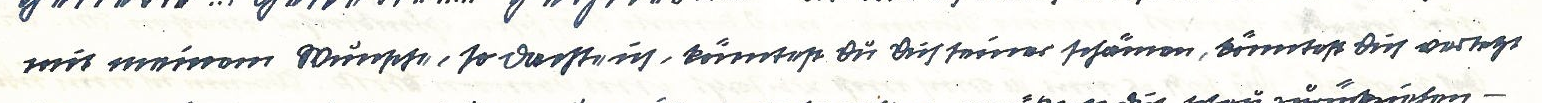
mit meinem Wunsche, so dachte ich, könntest Du Dich seiner schämen, könntest Dich verletzt
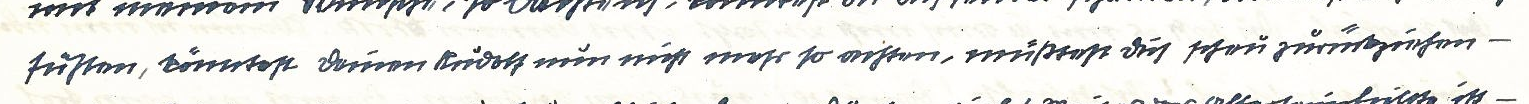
fühlen, könntest Deinen nun nicht mehr so achten, müßtest Dich scheu zurückziehen –
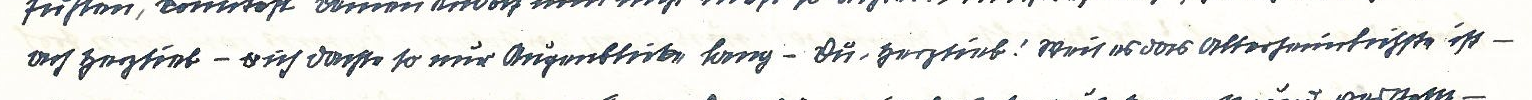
ach Herzlieb – ich dachte so nur Augenblicke lang – Du – Herzlieb! Weil es das Allerheiligste ist –
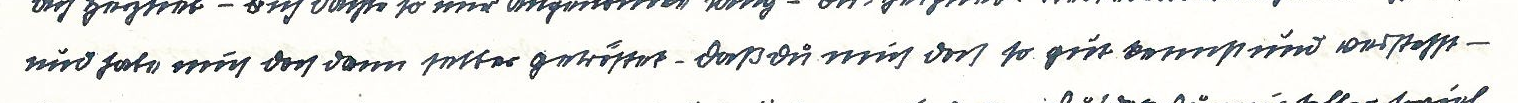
und habe mich doch dann selber getröstet – daß Du mich doch so gut kennst und verstehst –
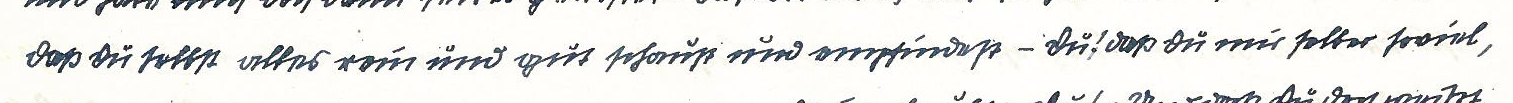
daß Du selbst alles rein und gut schaust und empfindest – Du! daß Du mir selber soviel,
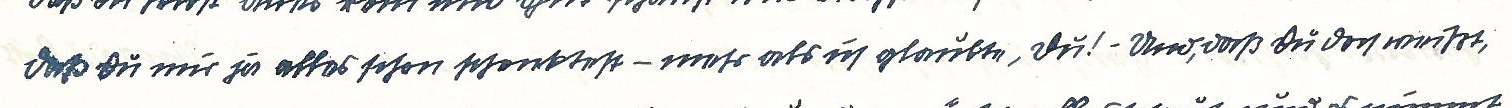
daß Du mir ja alles schon schenktest – mehr als ich glaubte, Du! – Und daß Du doch weißt,
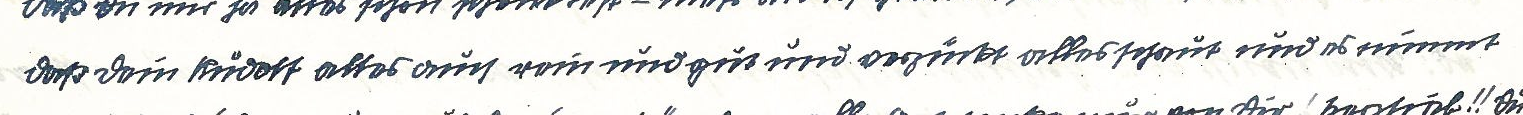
daß Dein alles auch rein und gut und verzückt alles schaut und es nimmt
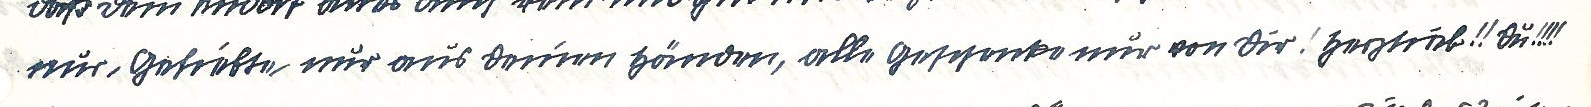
nur, Geliebte, nur aus Deinen Händen, alle Geschenke nur von Dir! Herzlieb! Du!!!!
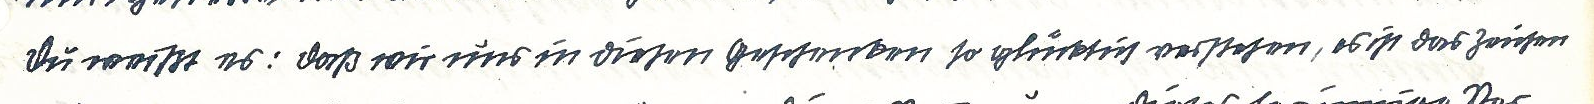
Du weißt es: daß wir uns in diesen Geschenken so glücklich verstehen, es ist das Zeichen
